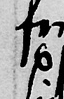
M.
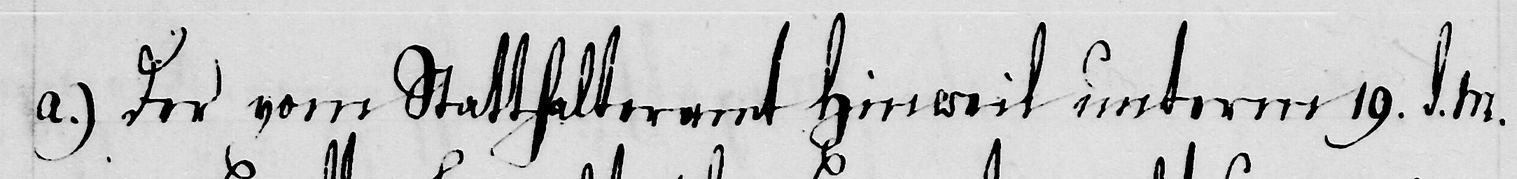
a.) Der vom Statthalteramt Hinweil unterm 19. d. M.
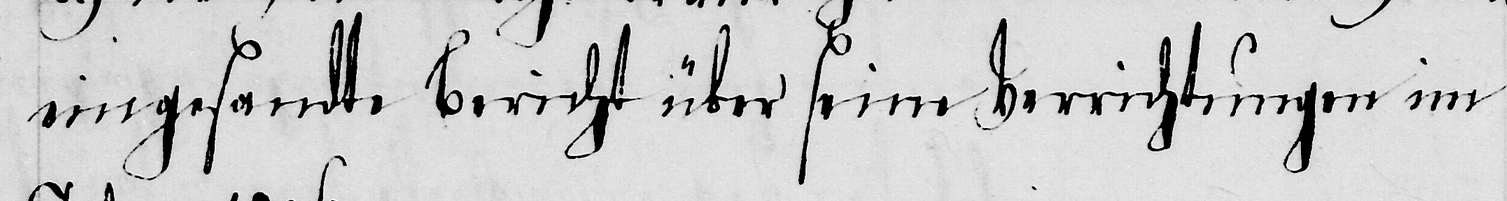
eingesandte Bericht über seine Verrichtungen im
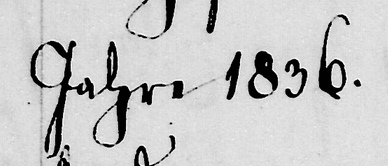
Jahre 1836.
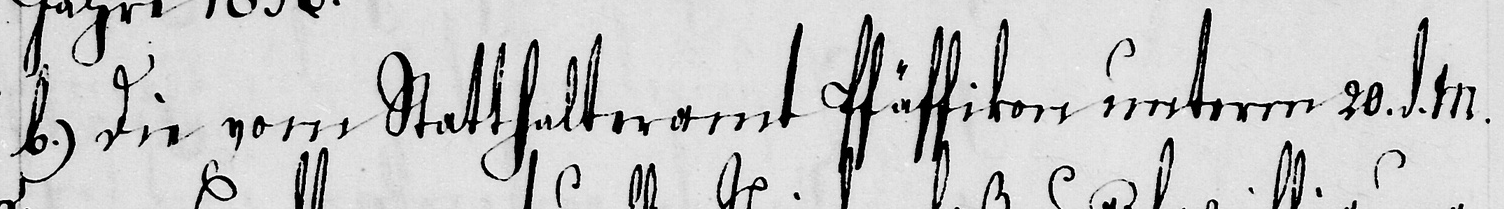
b.) Die vom Statthalteramt Pfäffikon unterm 20. d.
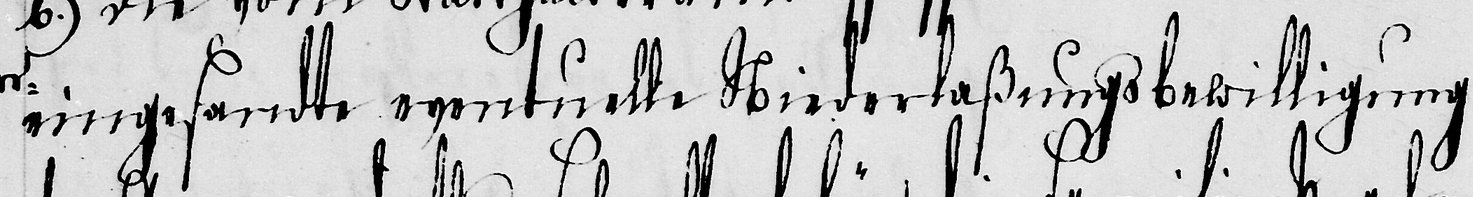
eingesandte eventuelle Niederlaßungsbewilligung
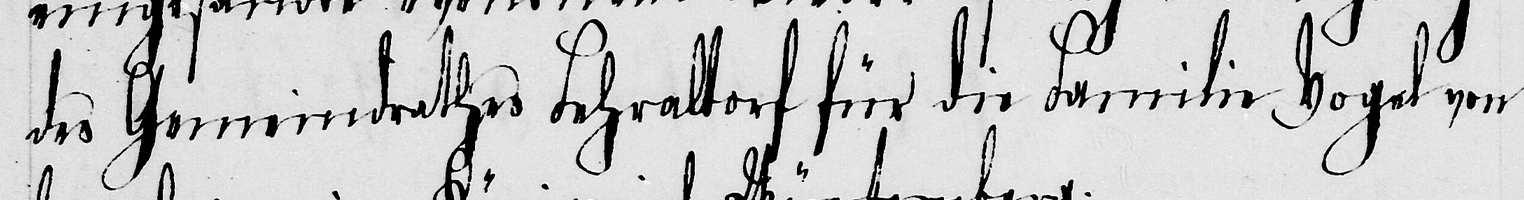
des Gemeindrathes Fehraltorf für die Familie Vogel von
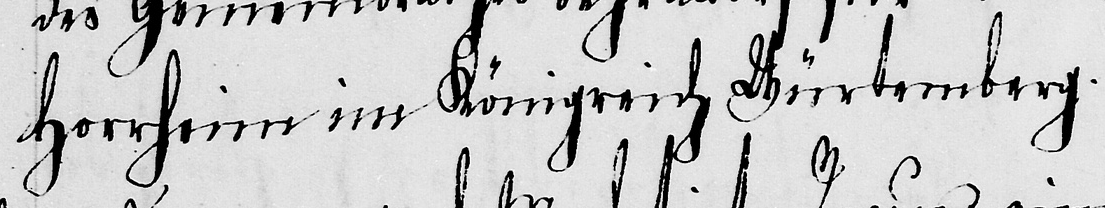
Horrheim im Königreich Würtemberg.
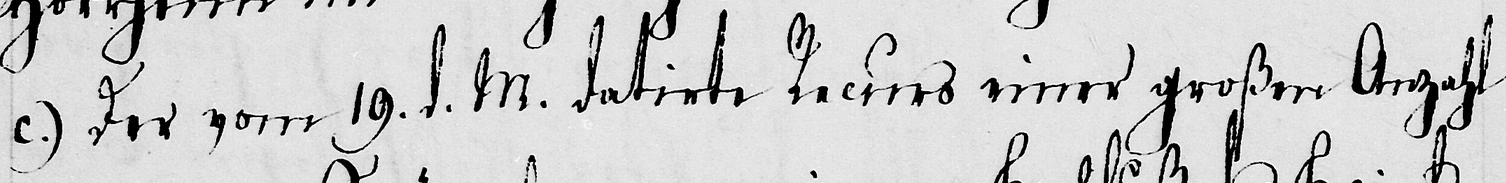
c.) Der vom 19. d. M. datirte Recurs einer großen Anzahl
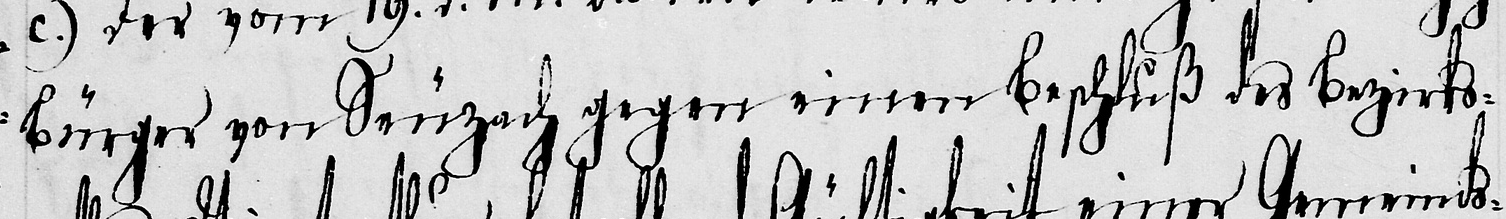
Bürger von Seuzach gegen einen Beschluß des Bezirks¬
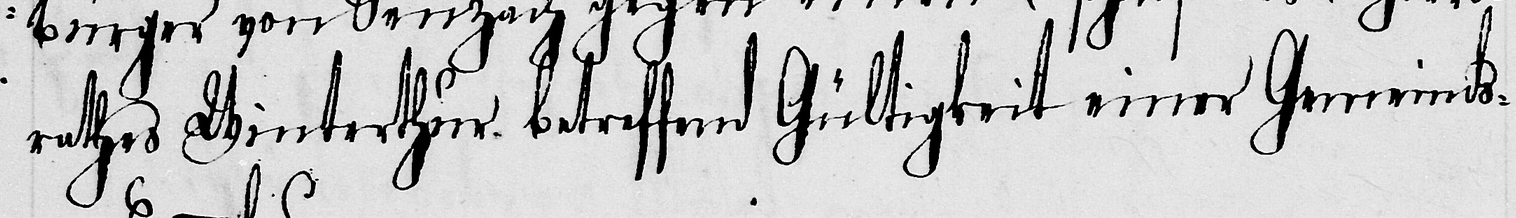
rathes Winterthur betreffend Gültigkeit einer Gemeinds¬
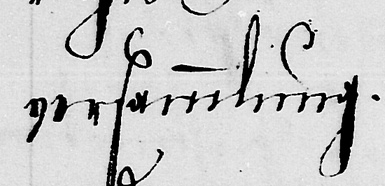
versammlung.
